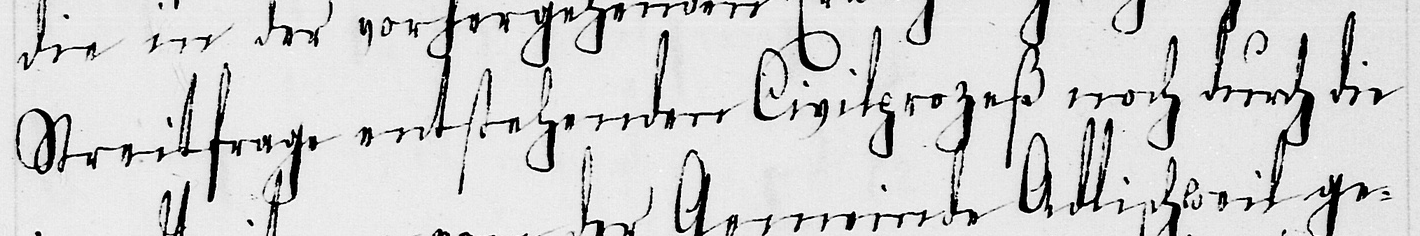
Streitfrage entstehenden Civilprozeß noch durch die
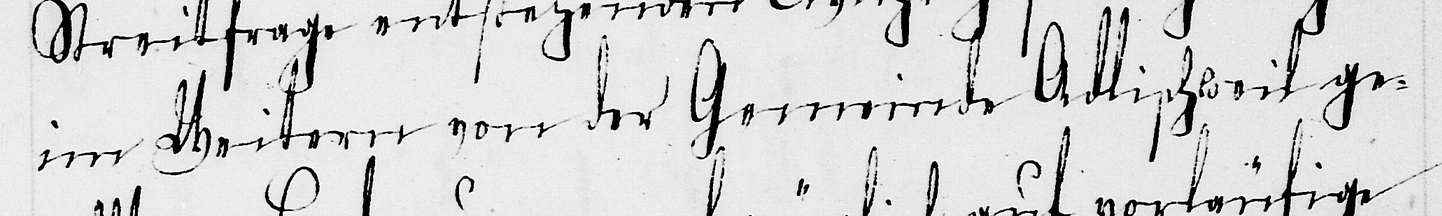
im Weitern von der Gemeinde Adlischweil ges¬
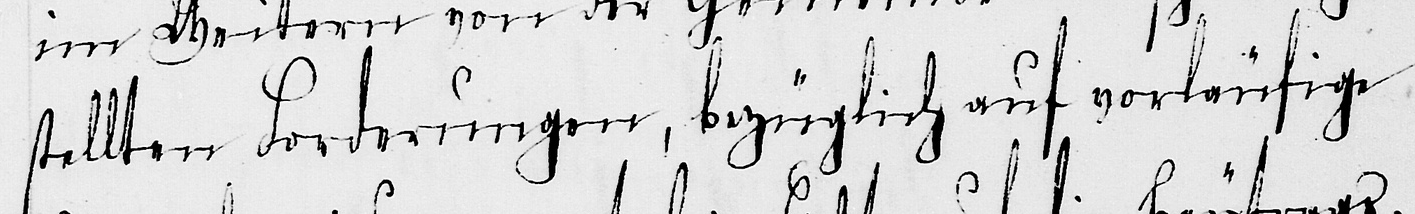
tellten Forderungen, bezüglich auf vorläufige
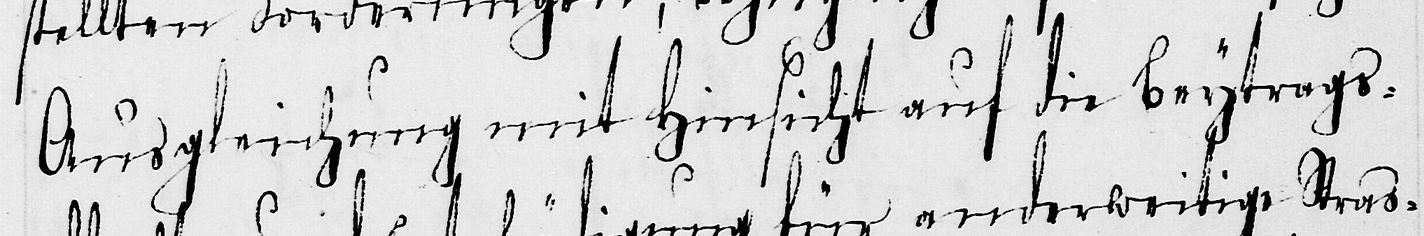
Ausgleichung mit Hinsicht auf die Beytrags¬
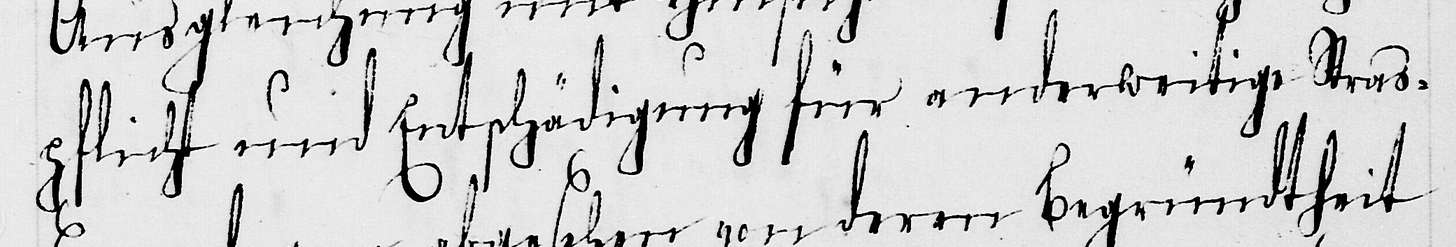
pflicht und Entschädigung für anderweitige Stras¬
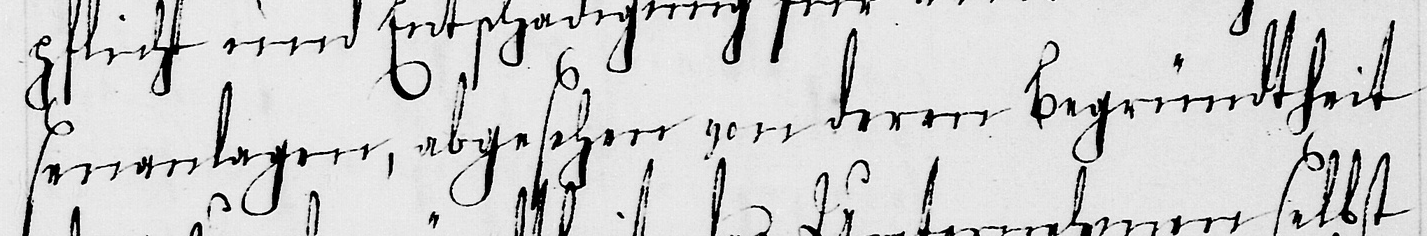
senanlagen, abgesehen von deren Begründtheit
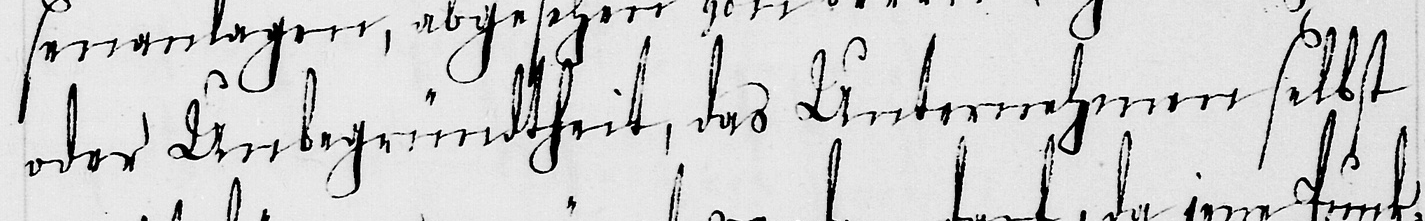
oder Unbegründtheit, das Unternehmen selbst
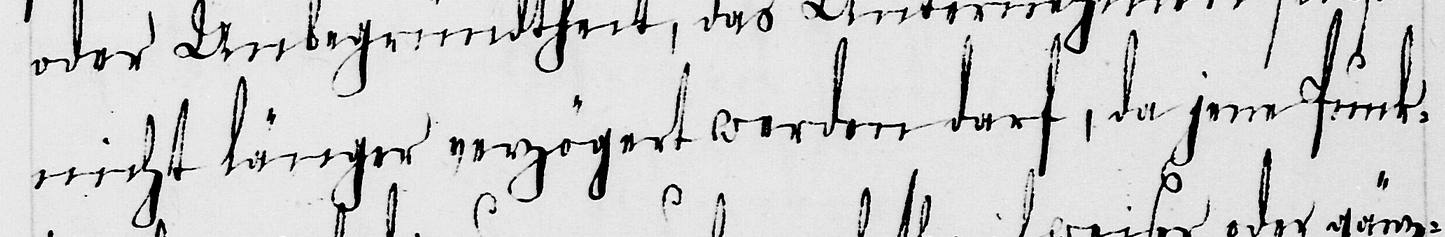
nicht länger verzögert werden darf, da jene Punk¬
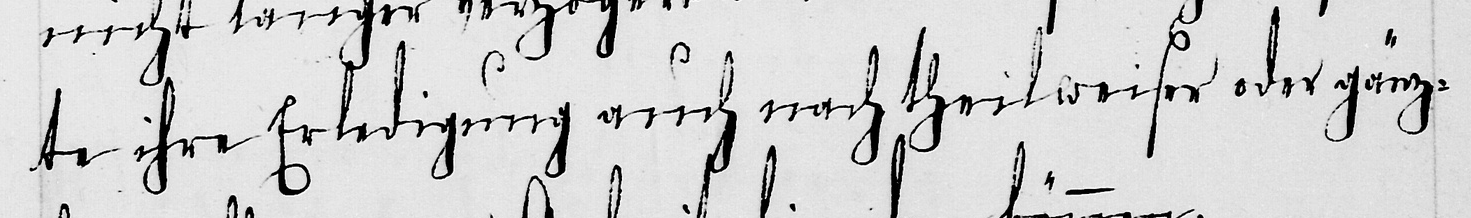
te ihre Erledigung auch nach theilweiser oder gänz¬
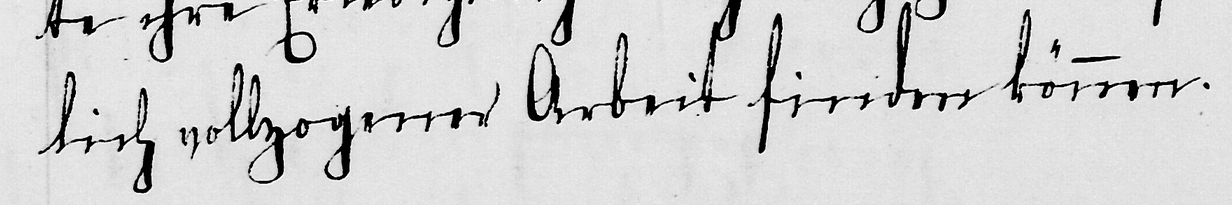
lich vollzogener Arbeit finden können.
